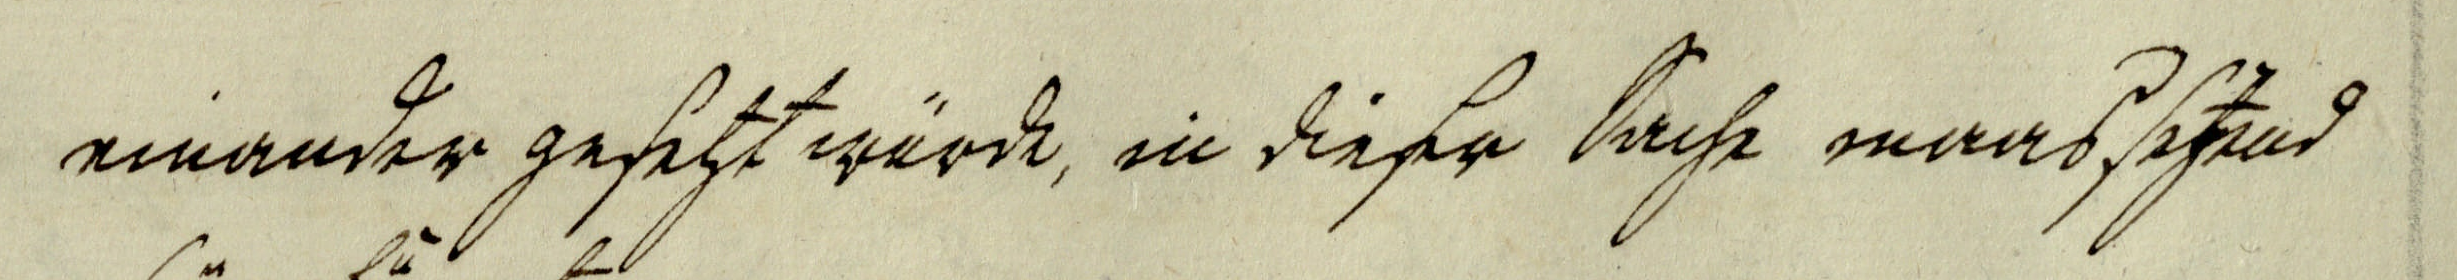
einander gesetzt würde, in dieser Sache maassetzend
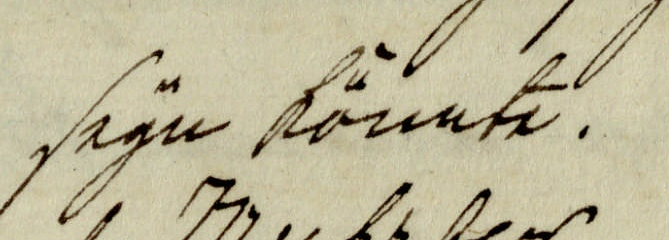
seÿn könnte.
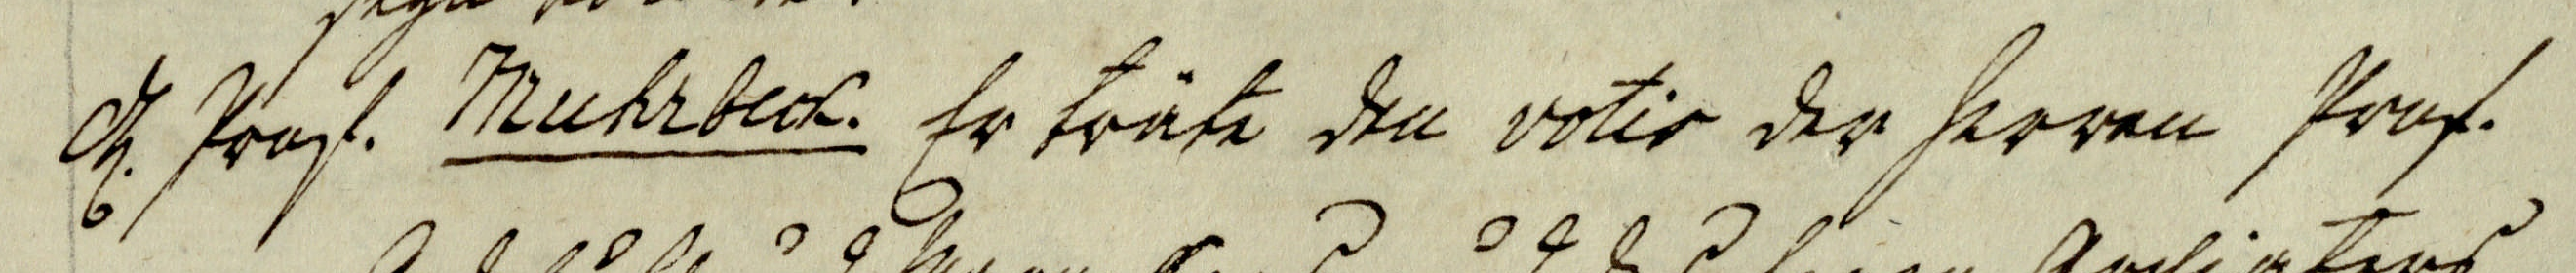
dh. Prof. Muhrbeck. Er träte den votis der Herren Prof.
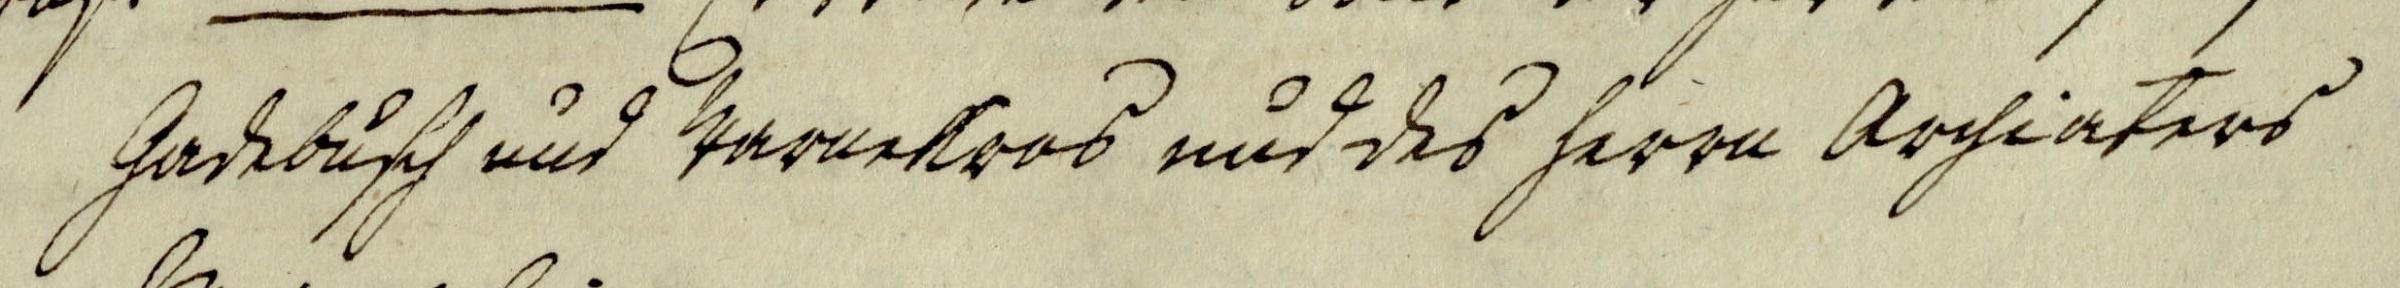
Gadebusch und Warnekros und des Herrn Archiaters
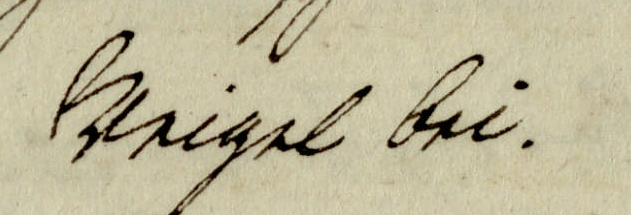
Weigel bei.
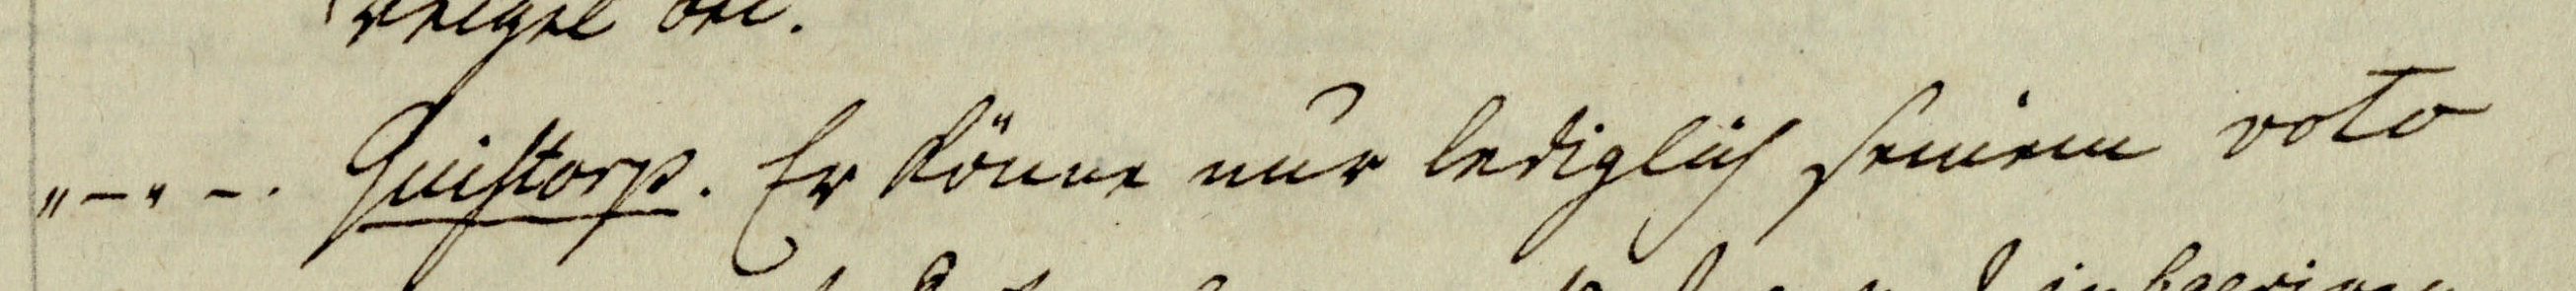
Quistorp. Er könne nur lediglich seinem voto
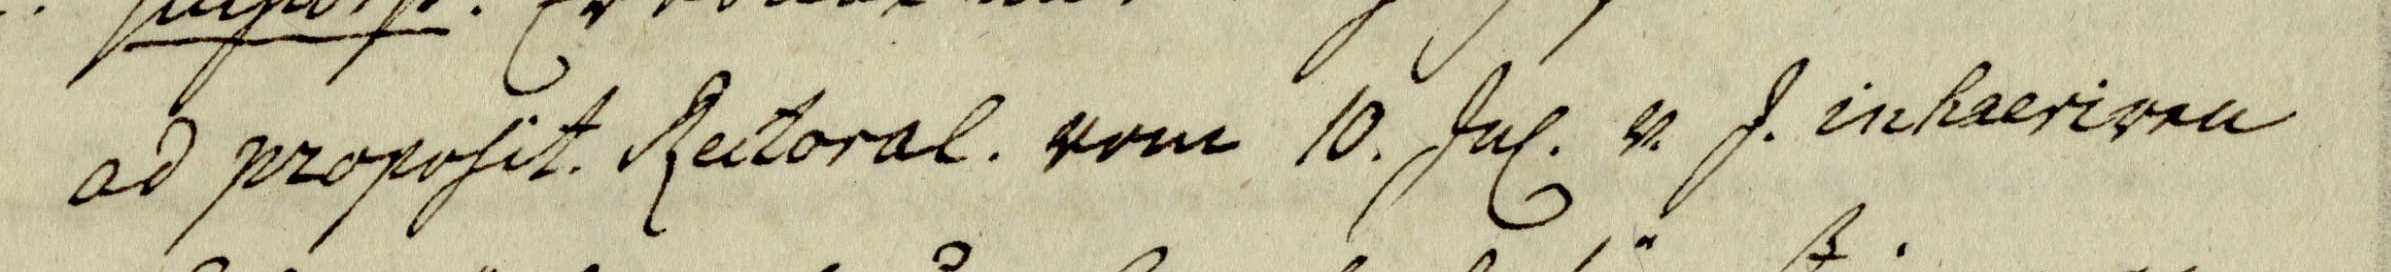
ad proposit. Rectorat. vom 10. Jul. v. J. inhaeriren
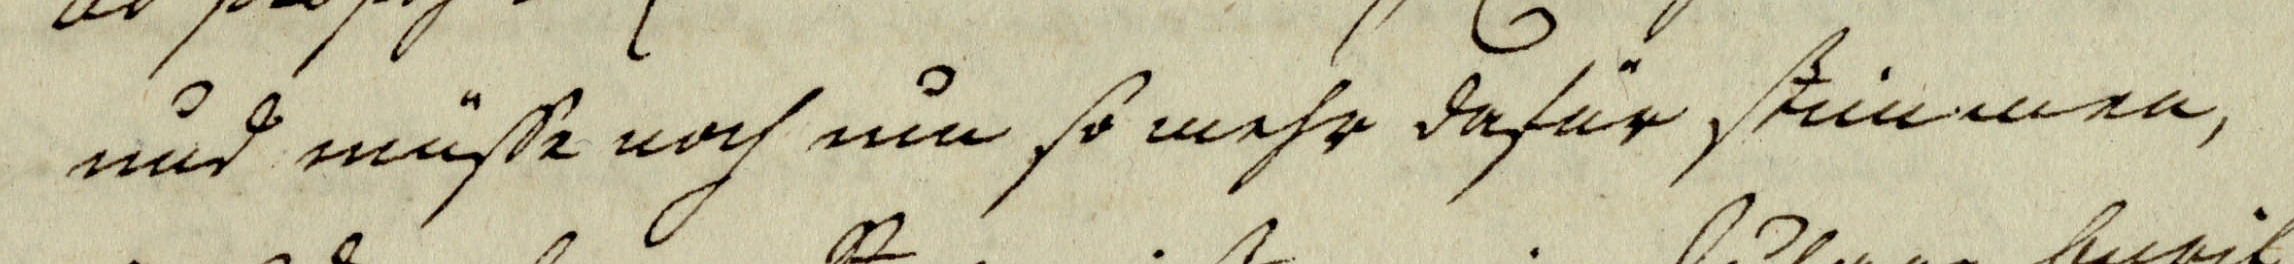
und müsse noch um so mehr dafür stimmen,
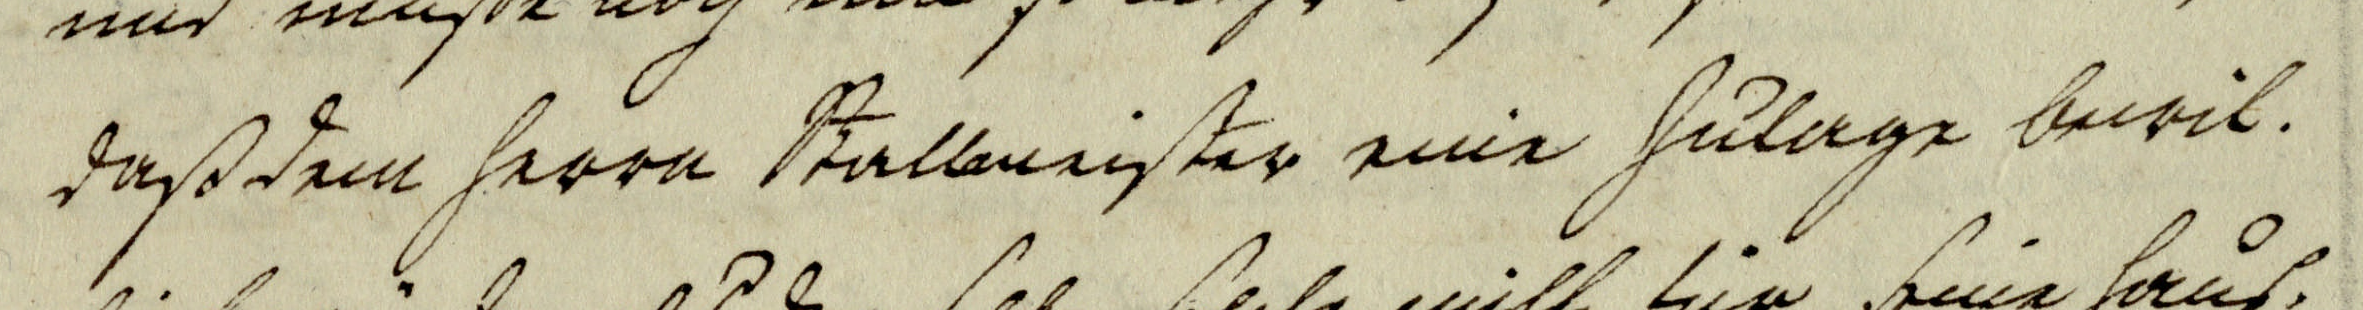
daß dem Herrn Stallmeister eine Zulage bewil¬
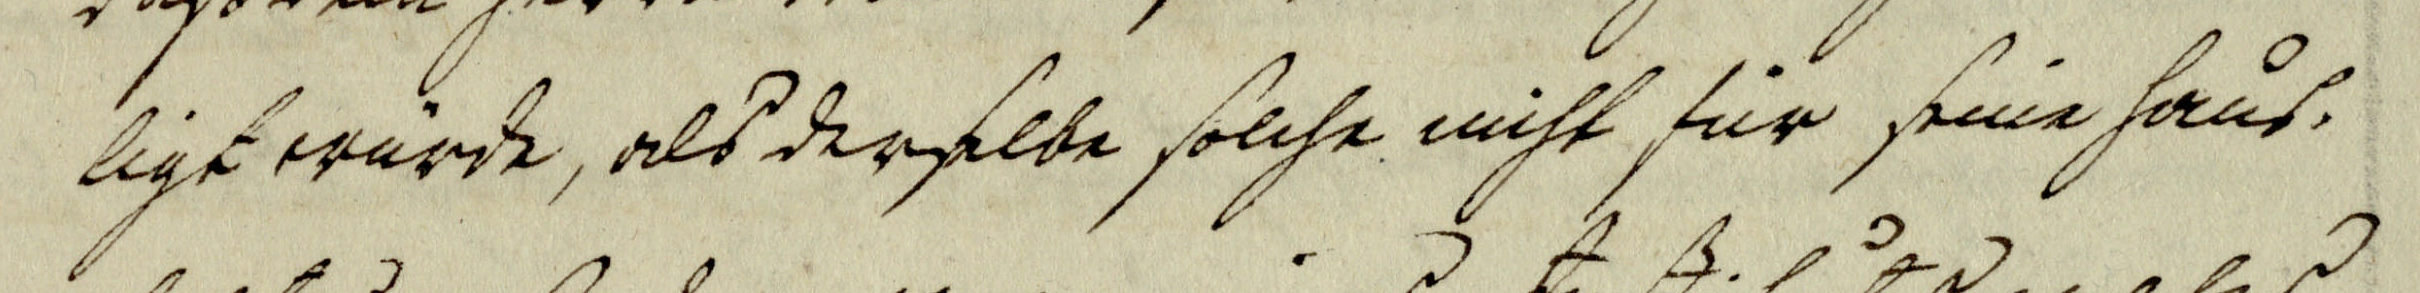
ligt würde, als derselbe solche nicht für seine Haus¬
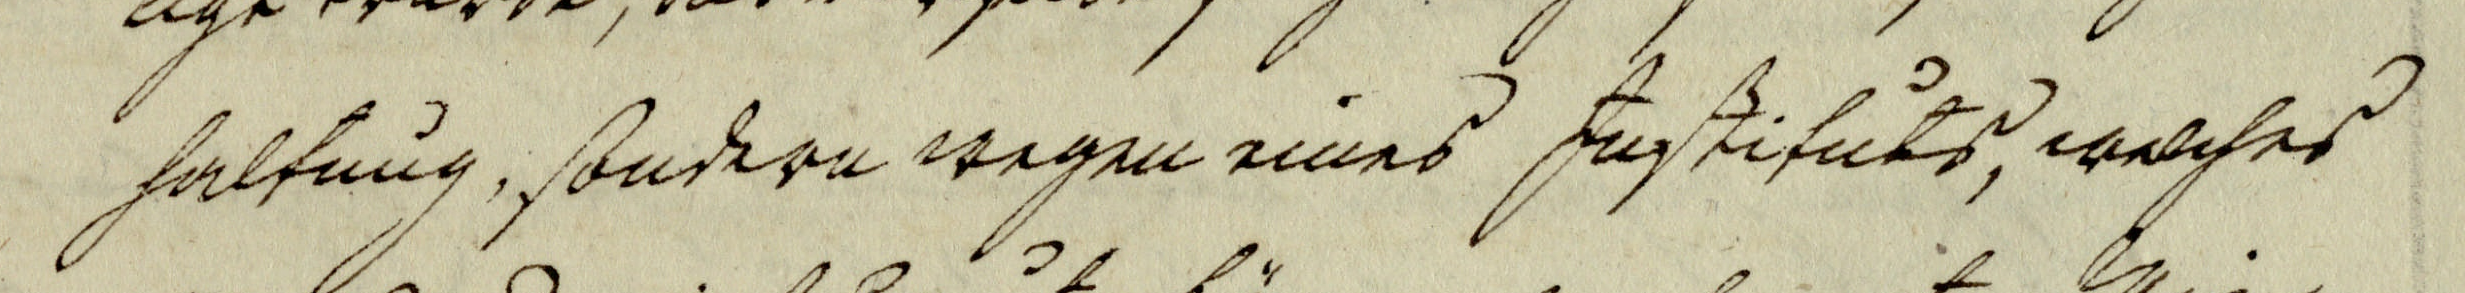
haltung, sondern wegen eines Instituts, welches
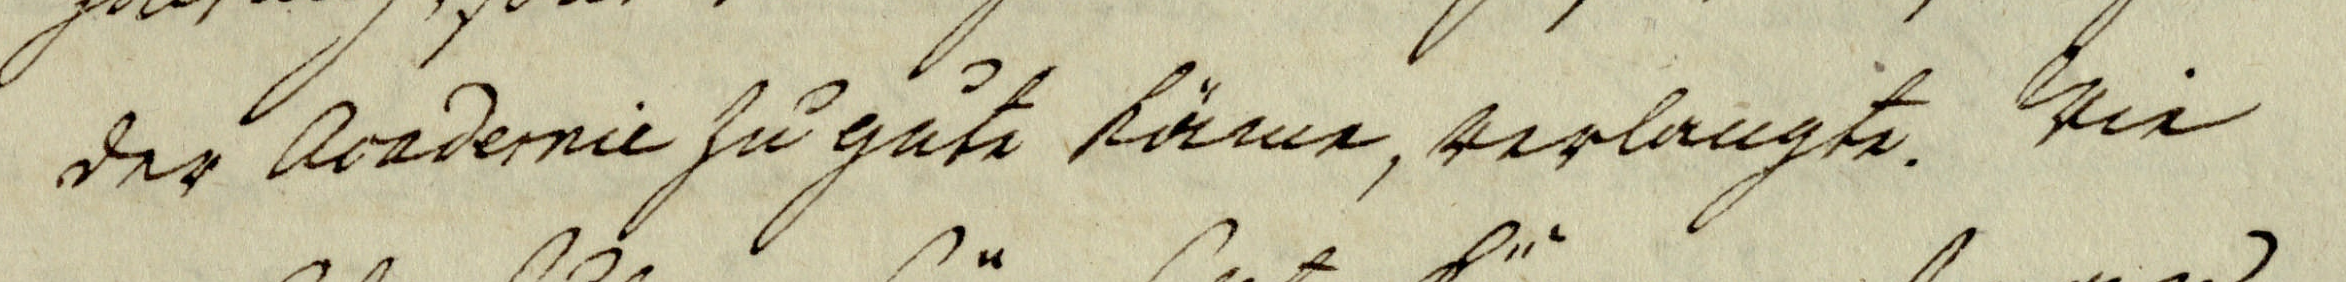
der Academie zu gute käme, verlangte. Wie
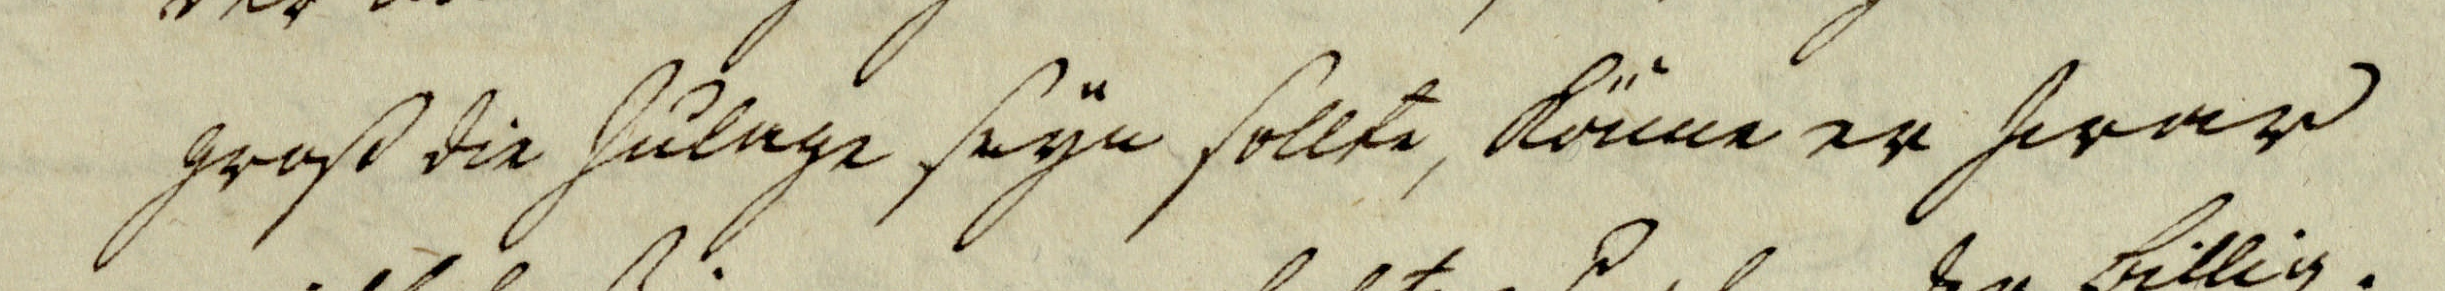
groß die Zulage seÿn sollte, könne er zwar
